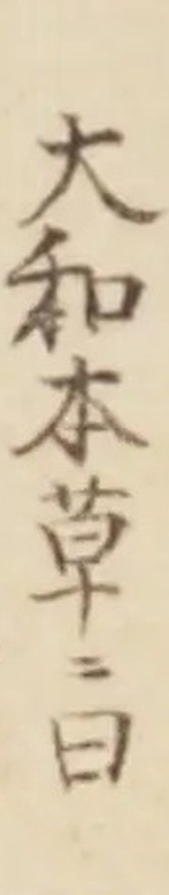大和本草曰
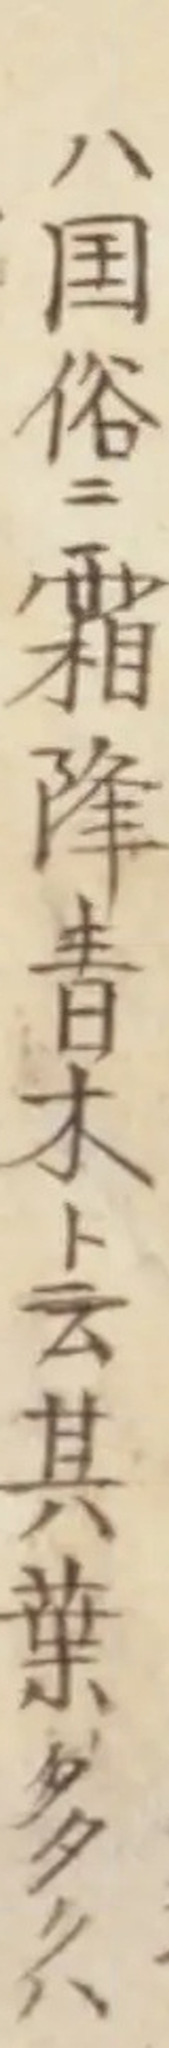ハ国俗ニ霜降青木ト云其葉多クハ
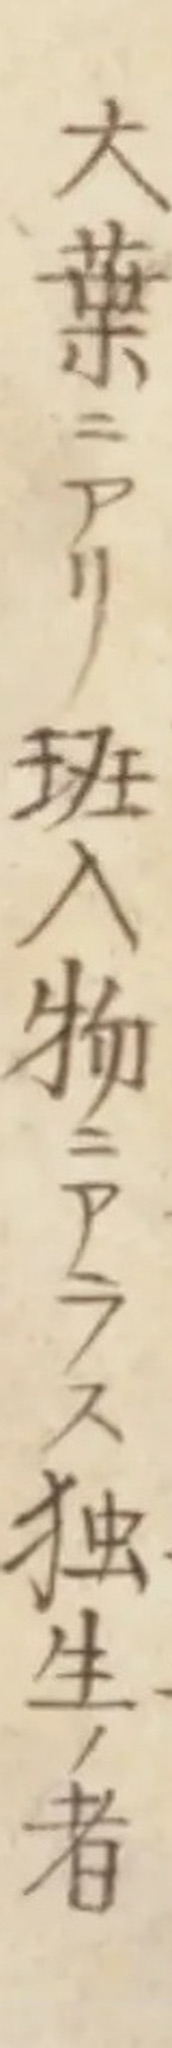大葉ニアリ斑入物ニアラス独生ノ者
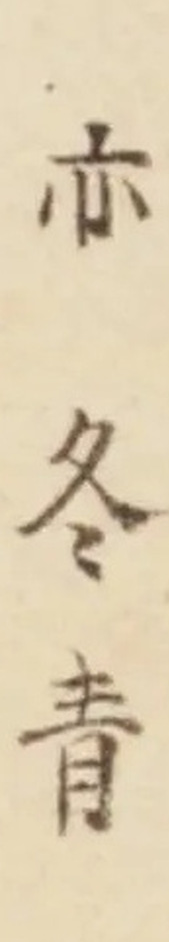亦冬青
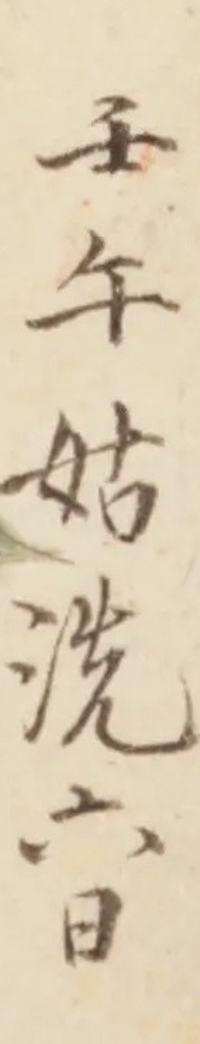壬午姑洗六日
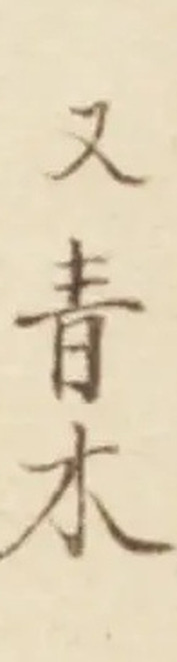又青木
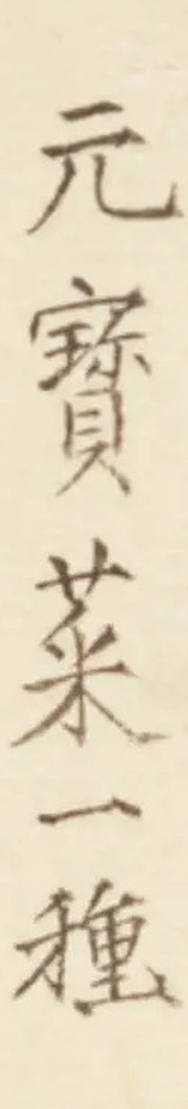元寶菜一種
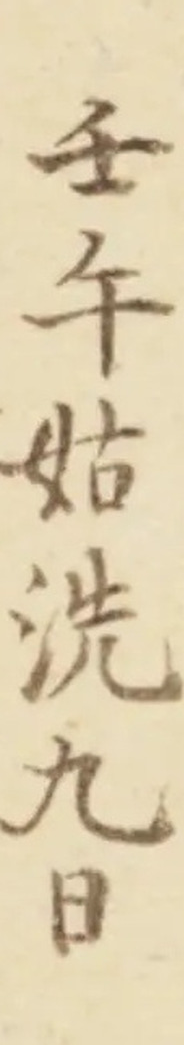壬午姑洗九日
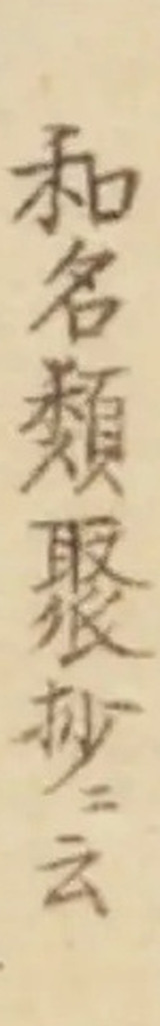和名類聚抄云

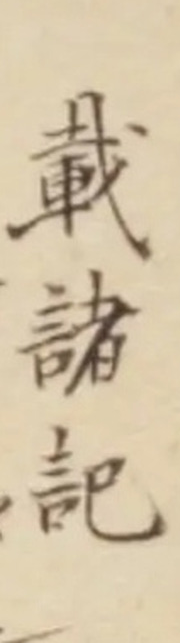載諸記
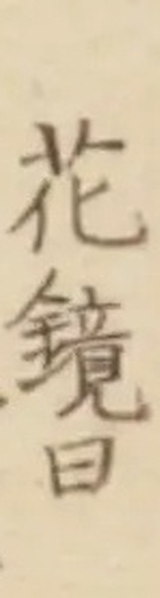花鏡曰
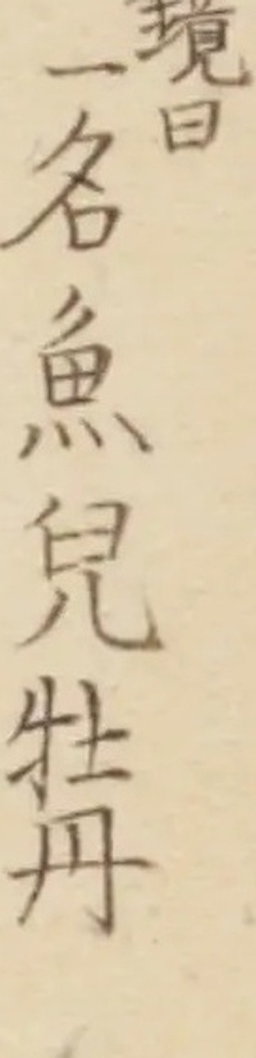一名魚児牡丹
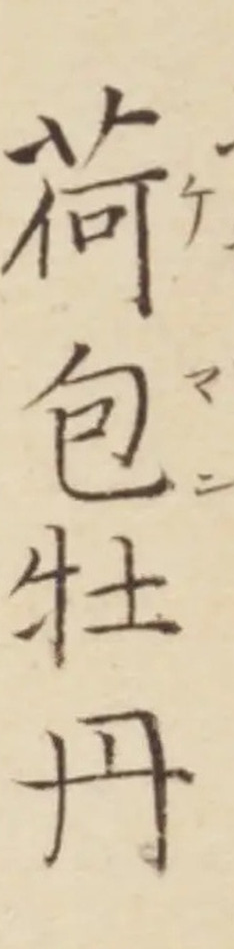荷包牡丹
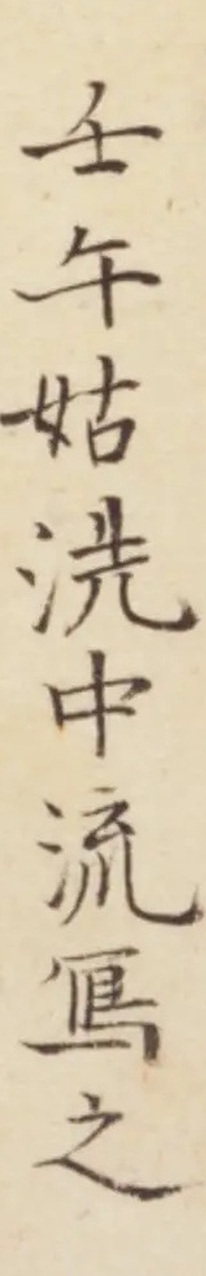壬午姑洗中流写之
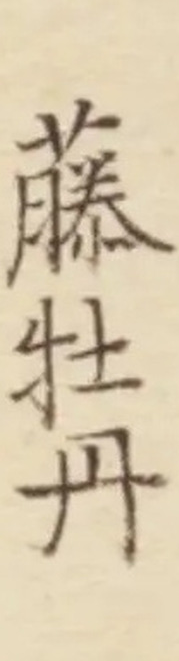藤牡丹

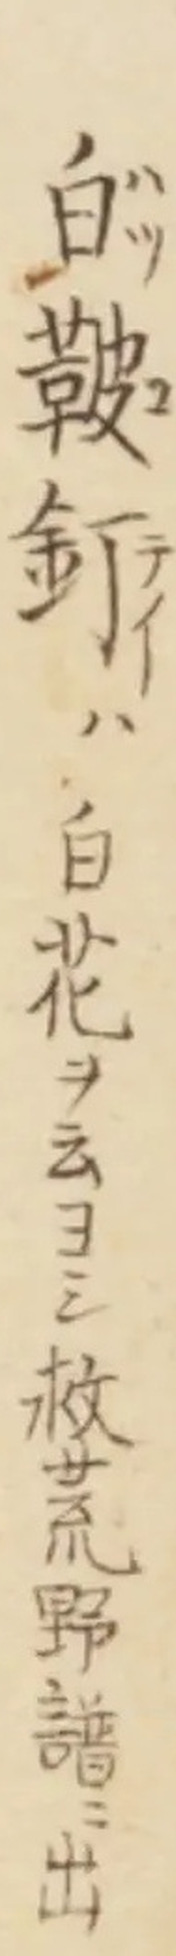白鞁釘白花ヲ云ヨシ救荒野譜ニ出
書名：梅園草木花譜春之部. 1
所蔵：国立国会図書館 National Diet Library, JAPAN
